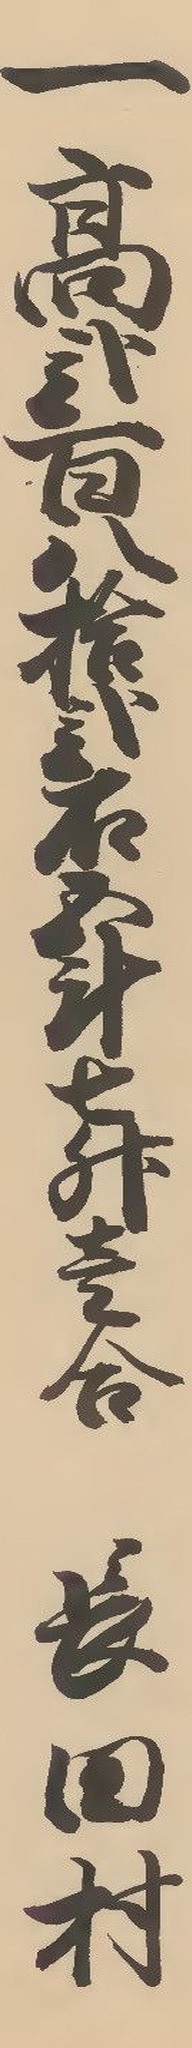一髙弐百八拾弐石五斗七升壱合長田村

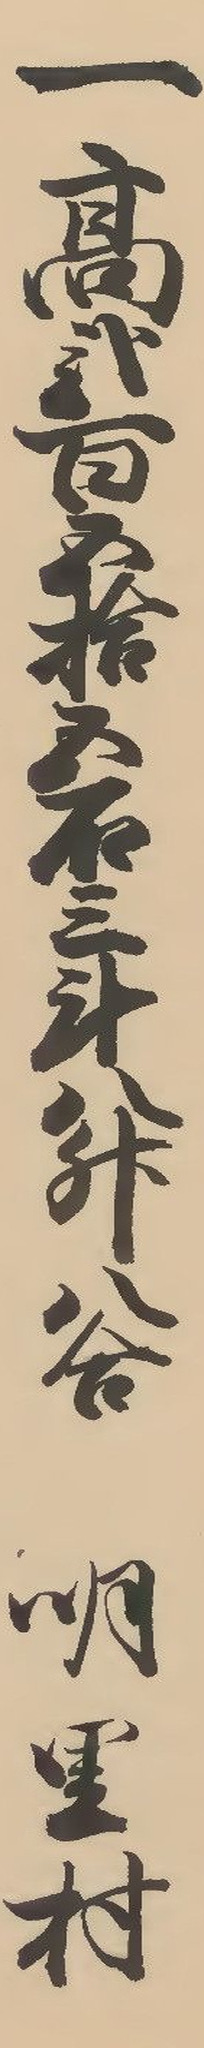一髙弐百五拾五石壱三斗八升八合明里村
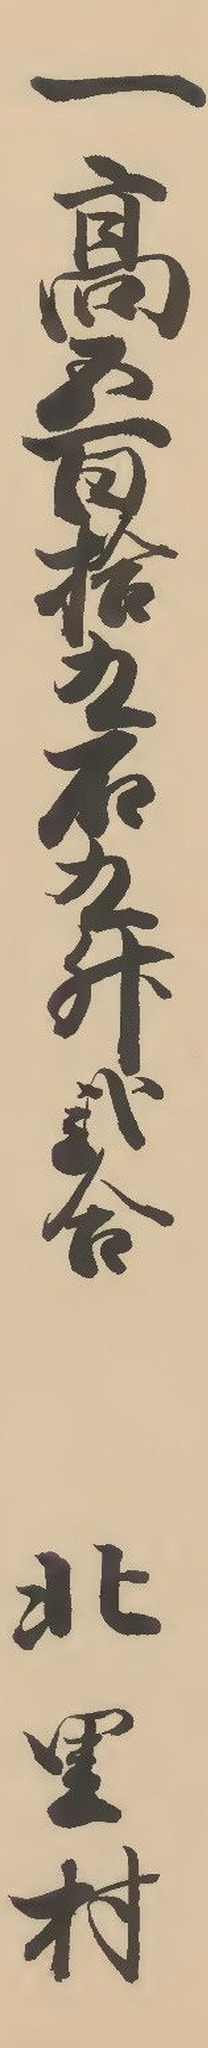一髙五百拾九石九斗弐合北里村
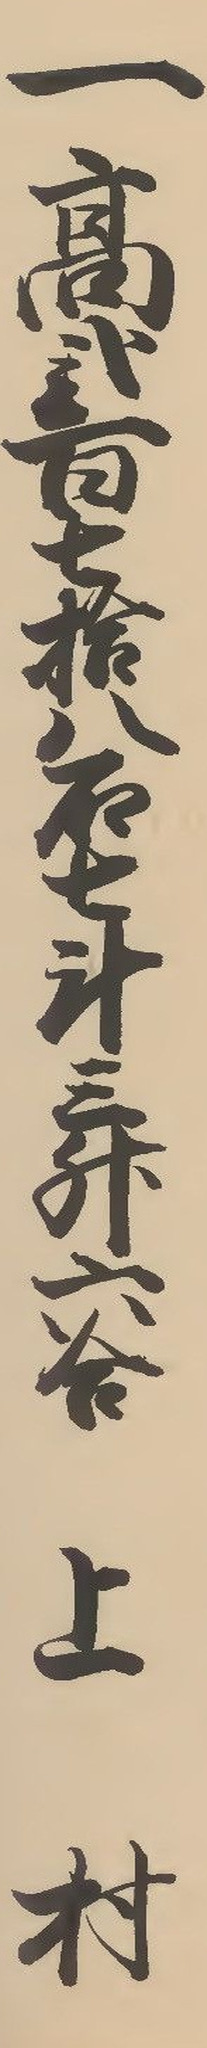一髙弐百七拾八石七斗三升六合上村
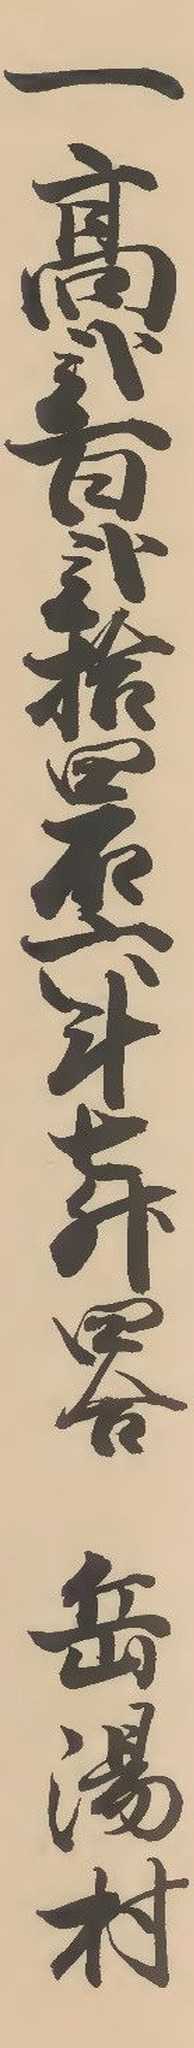一髙弐百弐拾四石六斗七升四合岳湯村
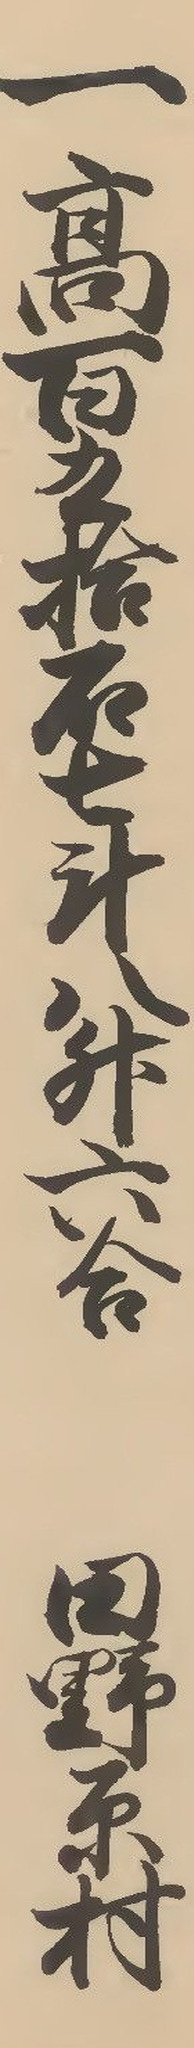一髙百九拾石七斗八升六合田野原村
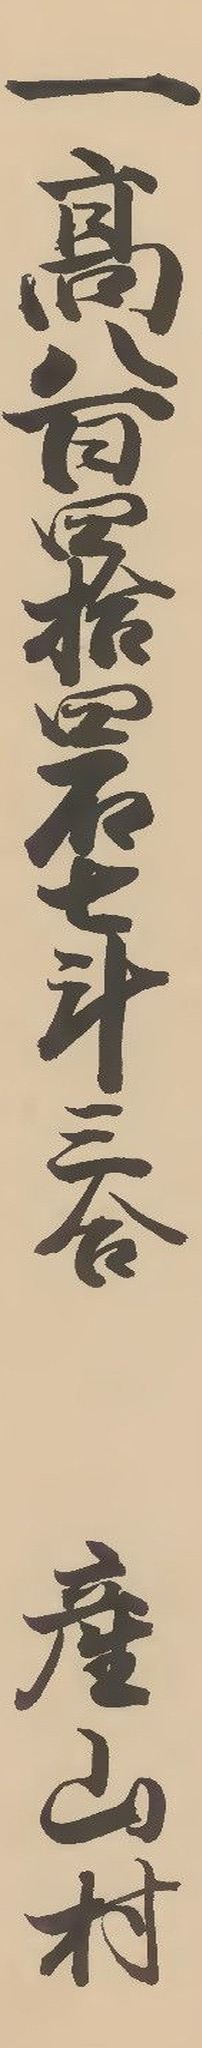一髙八百四拾四石七升三合産山村
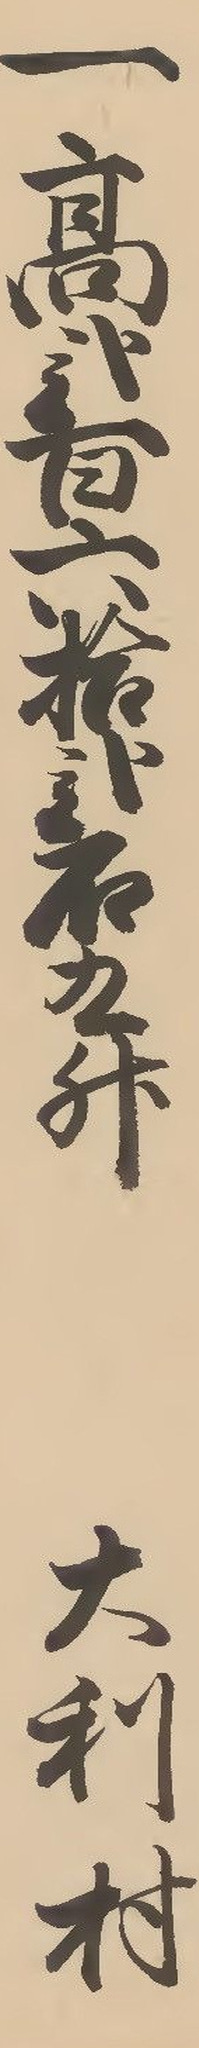一髙弐百六拾弐石九升大利村

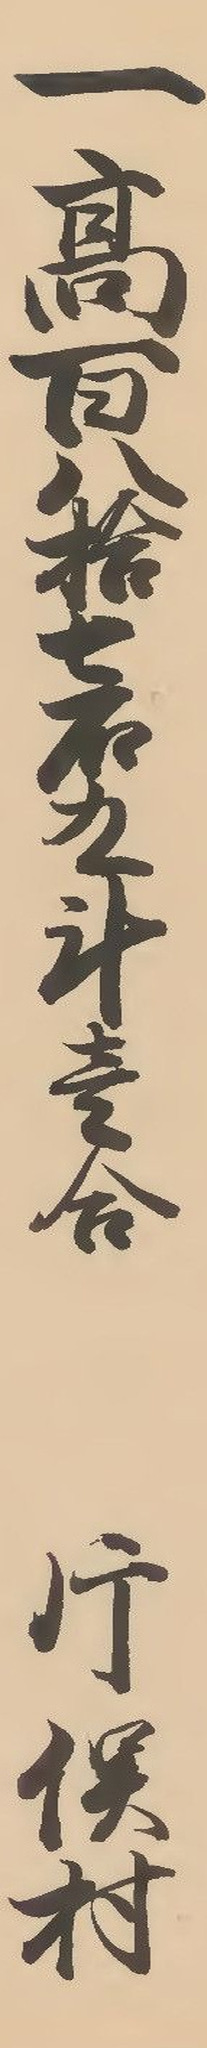一髙百八拾七石九斗壱合片俣村
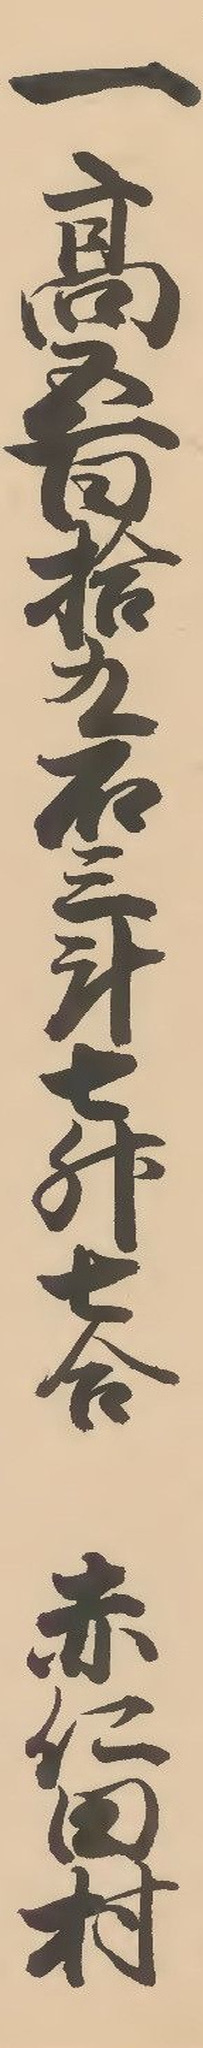一髙五百拾九石三斗七升七合赤仁田村
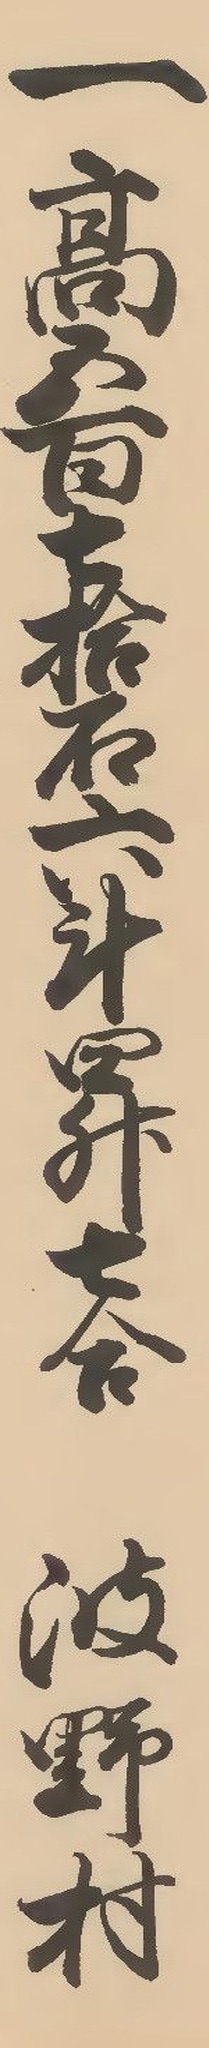一髙五百七拾石六斗四升七合波野村
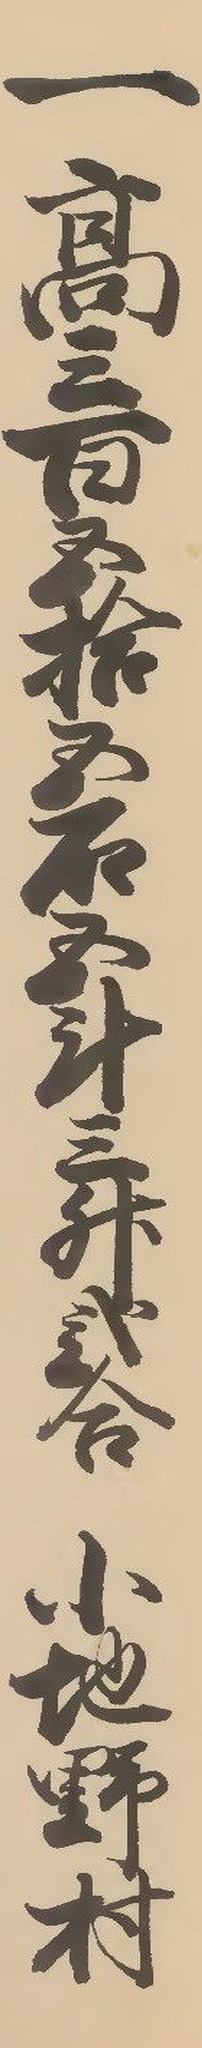一髙三百五拾五石五斗三升弐合小地野村
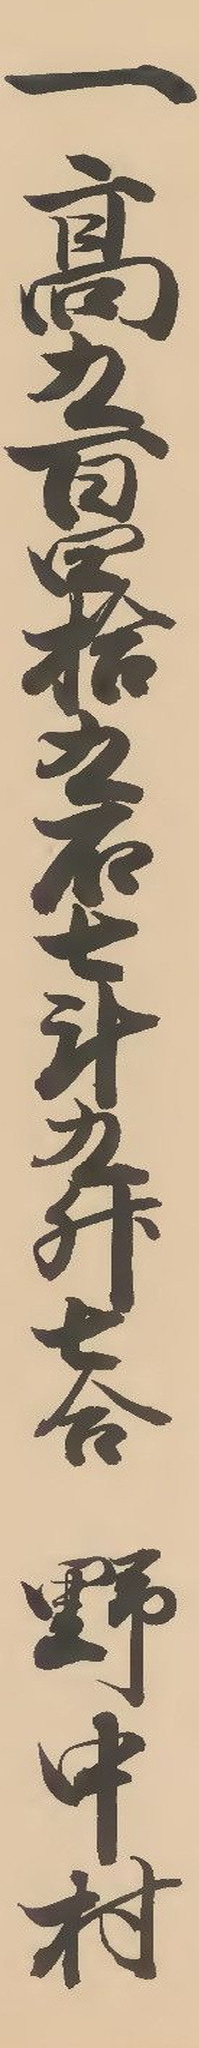一髙九百四拾九石七斗九升七合野中村
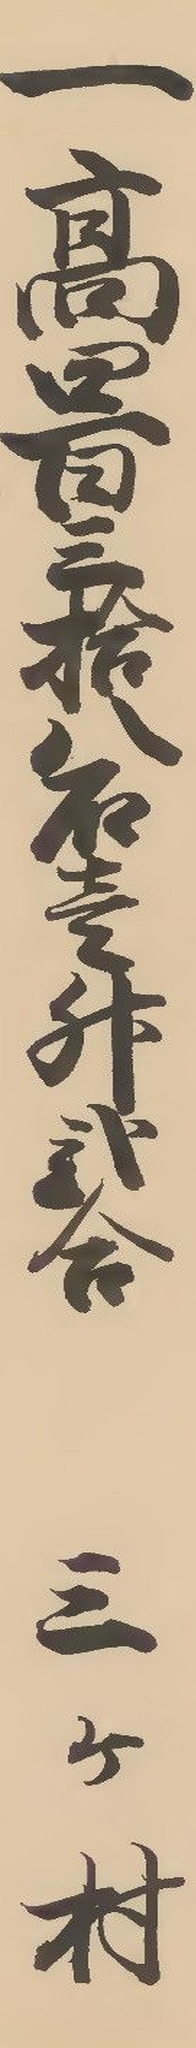一髙四百三拾八石壱升弐合三ケ村
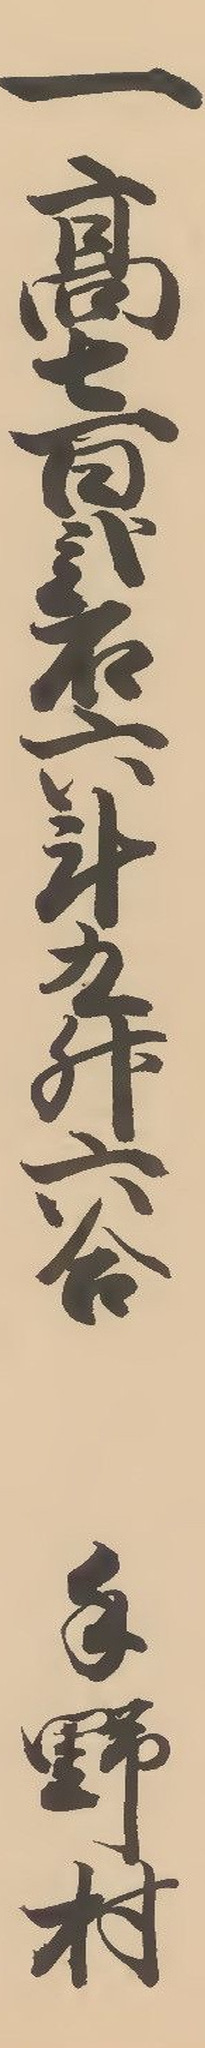一髙七百弐石六斗九升六合手野村
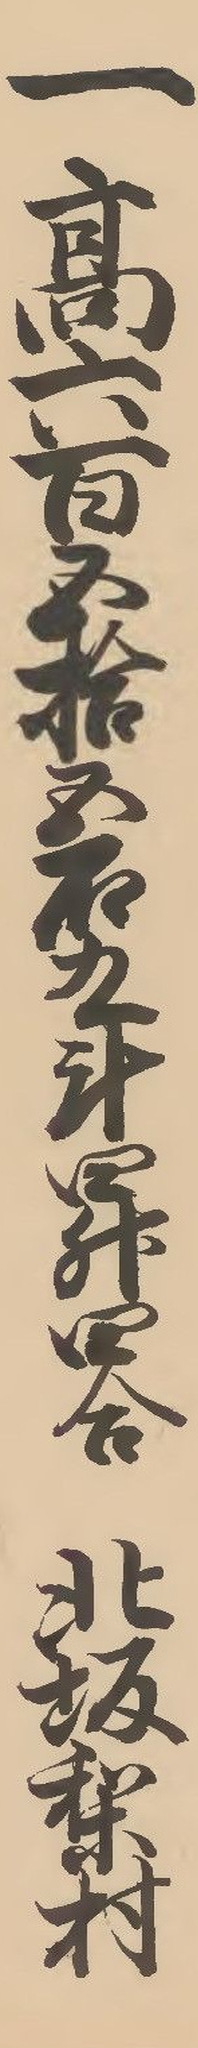一髙六百五拾五石九斗四升四合北坂梨村
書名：肥後国郷帳
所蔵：国立公文書館 National Archives of Japan
